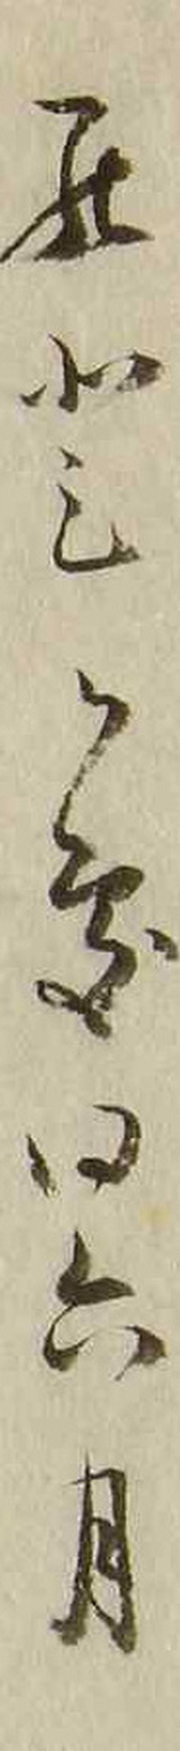罷登候処同六月
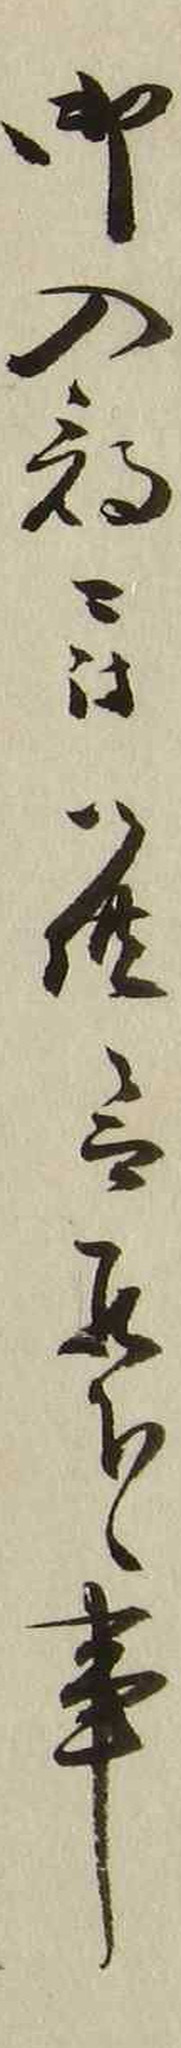御入部ニ付御供ニ而罷下候事
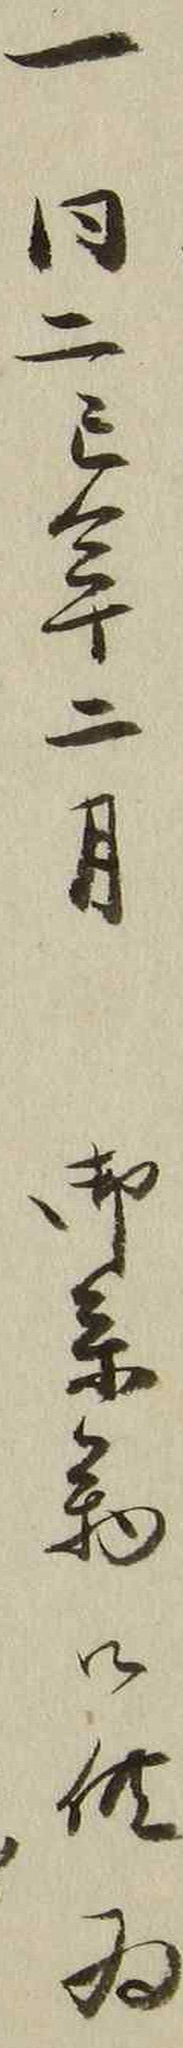一同二巳年二月御参勤御供為
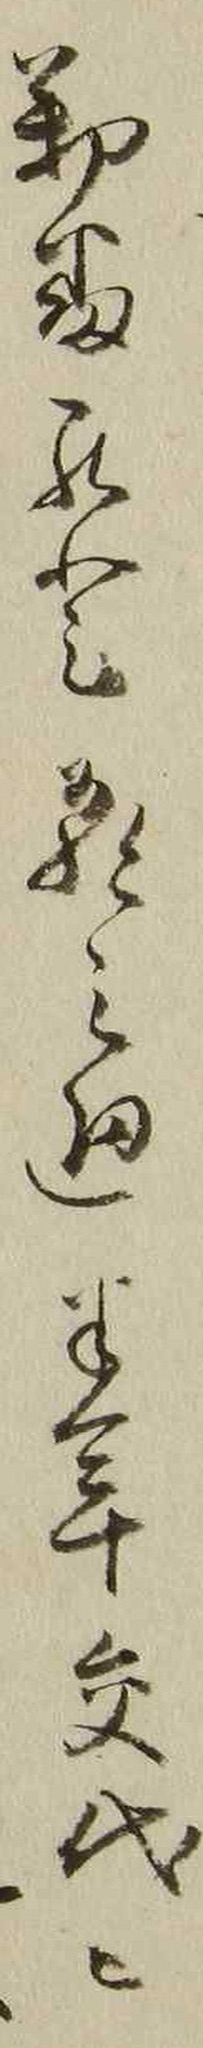勤番罷登願之通半年交代被
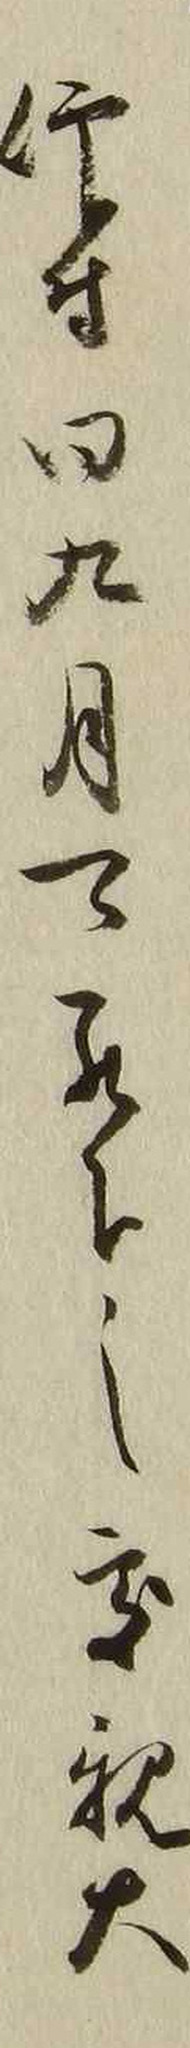仰付同九月可罷下之処親大
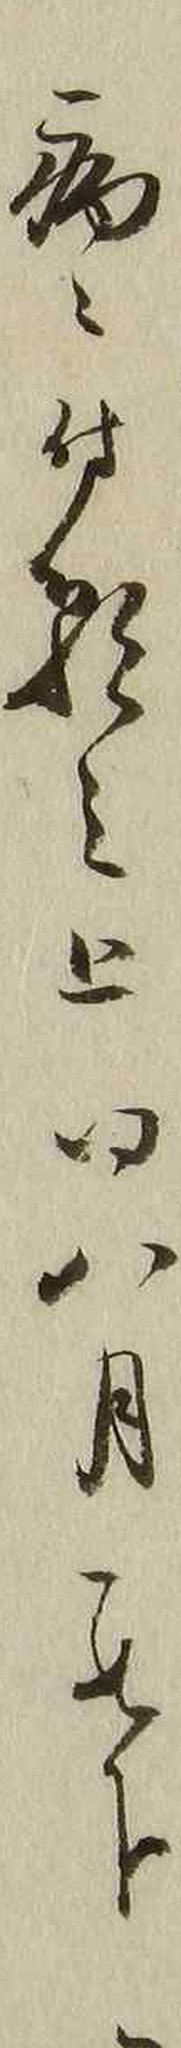病ニ付願之上同八月罷下候
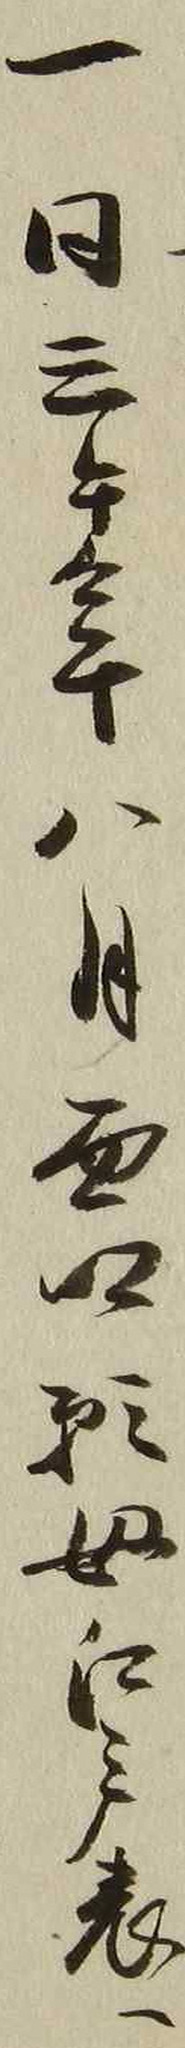一同三午年八月西郷頼母江戸表へ
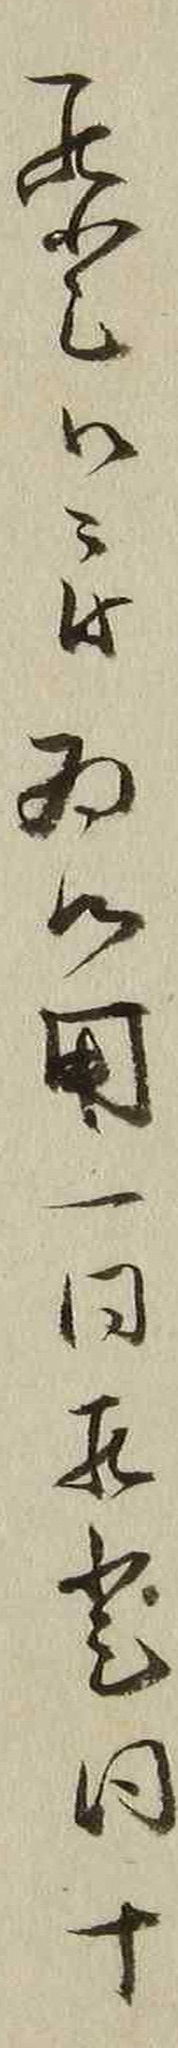罷登候ニ付為御用一同罷登同十
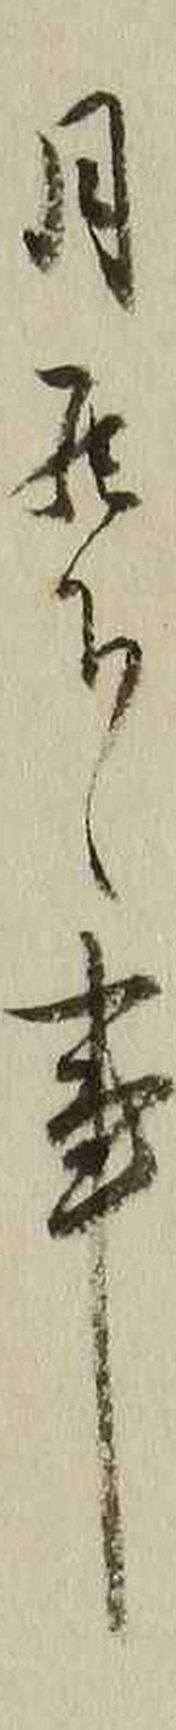月罷下候事
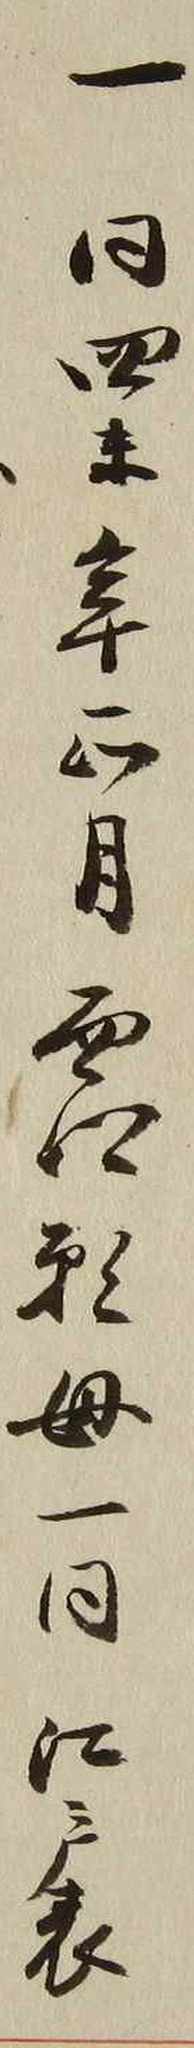一同四未年正月西郷頼母一同江戸表
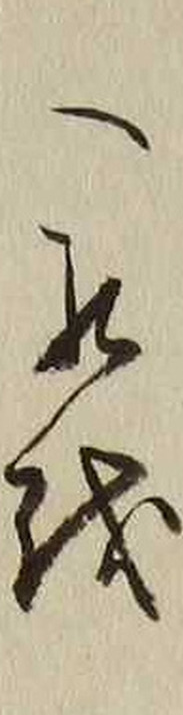へ罷越
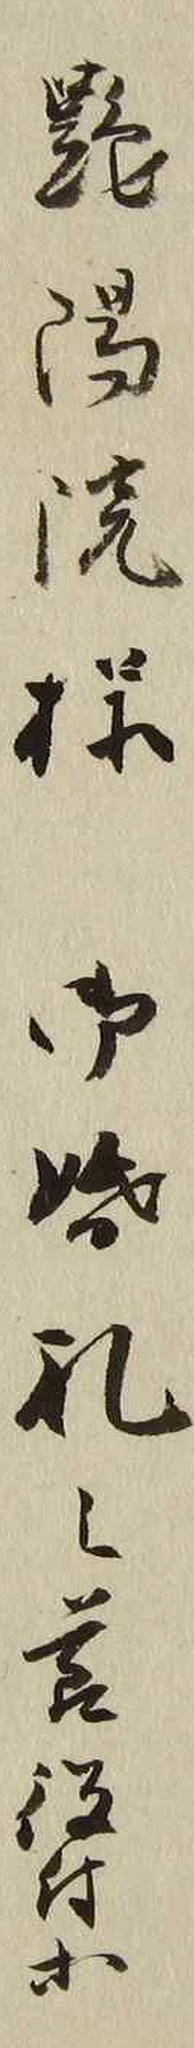艶陽院様御婚礼之節役付等
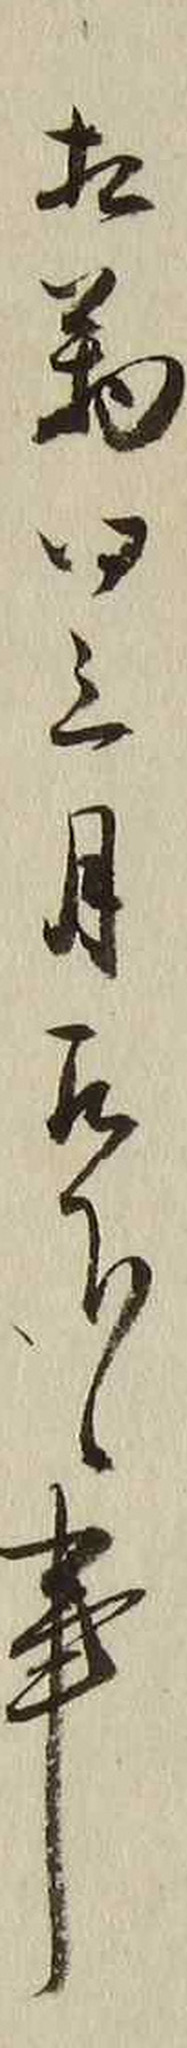相勤同三月罷下候事
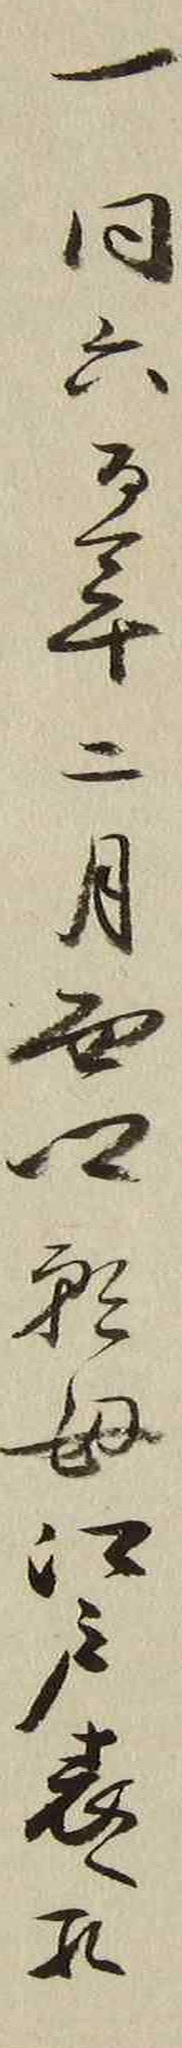一同六酉年二月西郷頼母江戸表へ罷
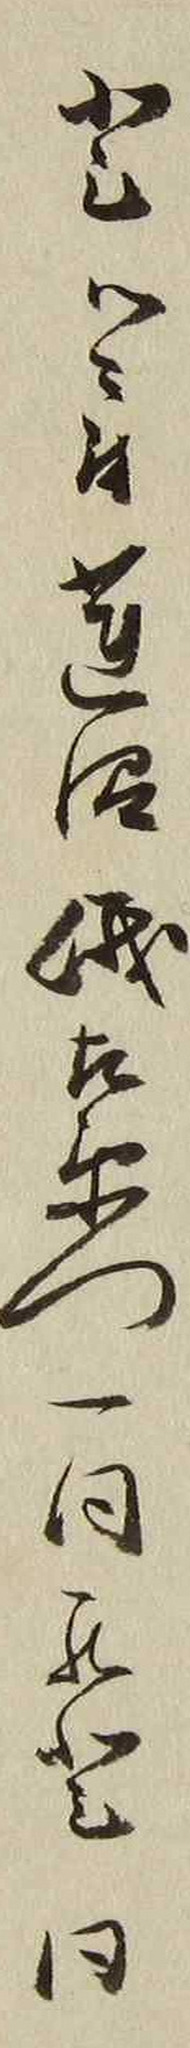登候ニ付蓮沼儀左衛門一同罷登同
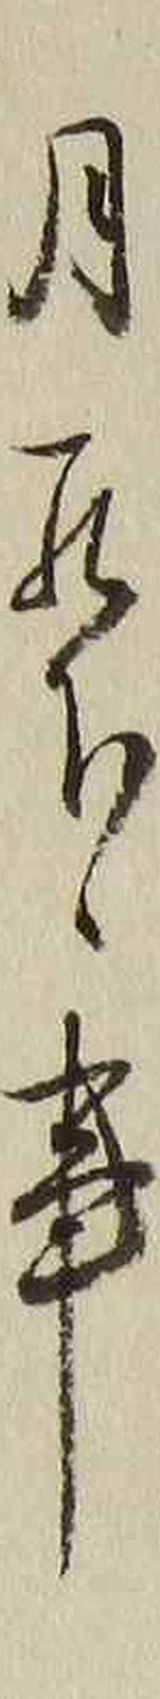月罷下候事
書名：諸士系譜　巻之288　さ之部20
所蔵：会津若松市立会津図書館
